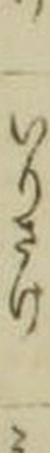いりさけ
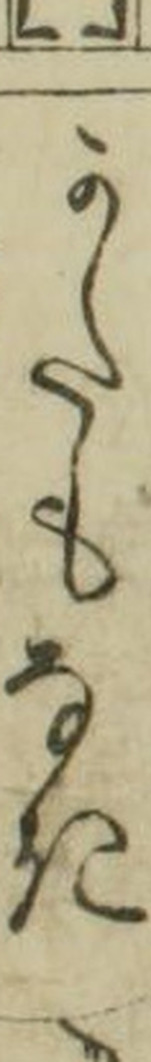かたもなき
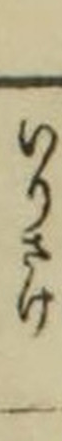いりさけ
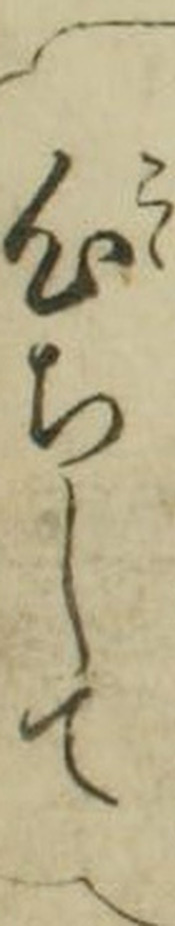心ちして

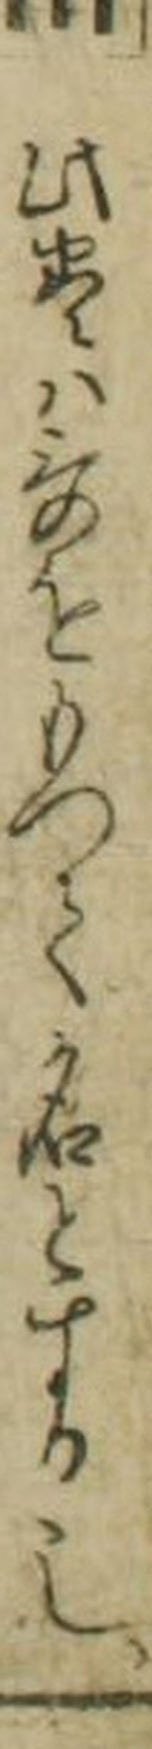此巻は哥をもつて名とする也。
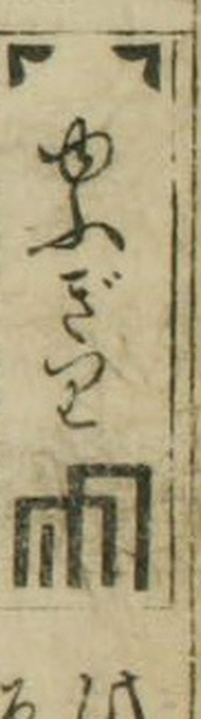ゆふぎり
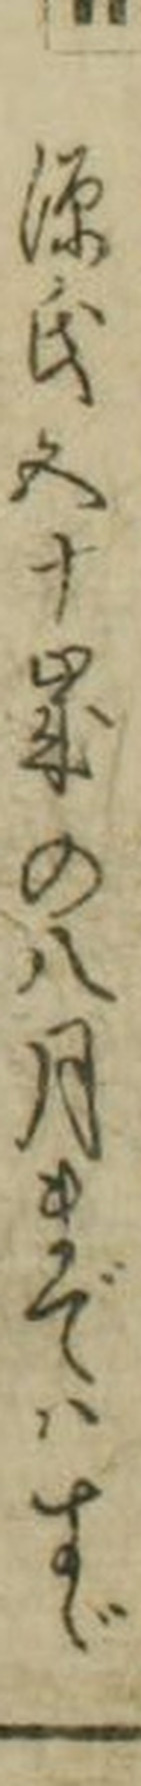源氏五十歳の八月まではすゞ
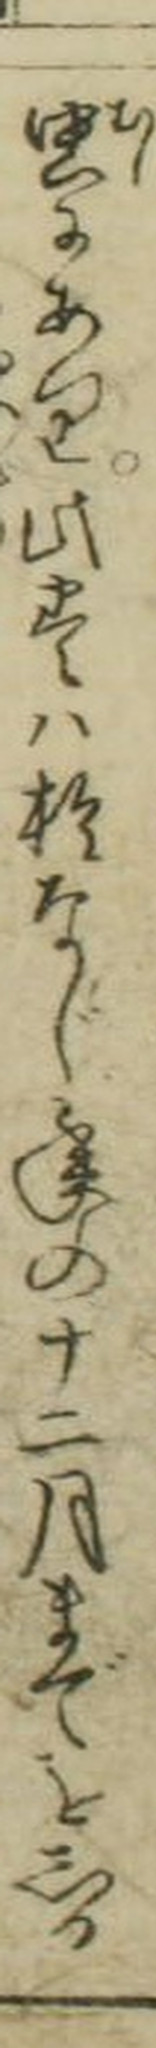虫にあり。此巻はおなじ年の十二月までをしる
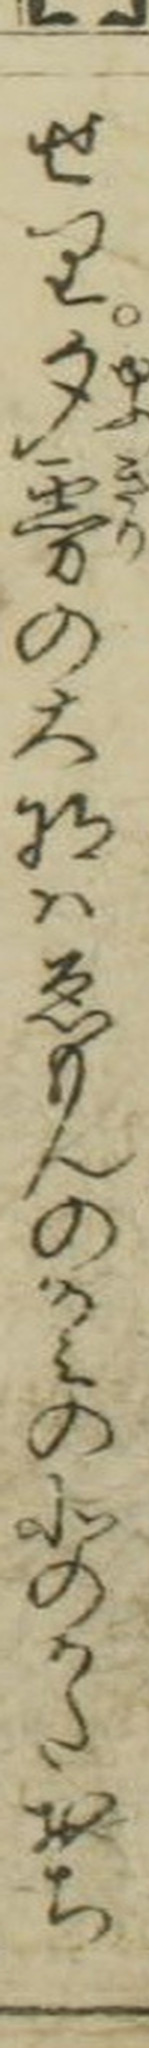せり。夕霧の大将はゑもんのかみの北のかたおち
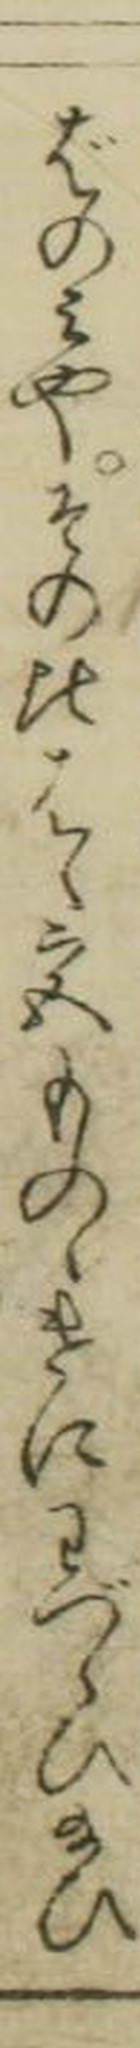ばのみや。その比はゝ宮ものゝけにわづらひ給ひ
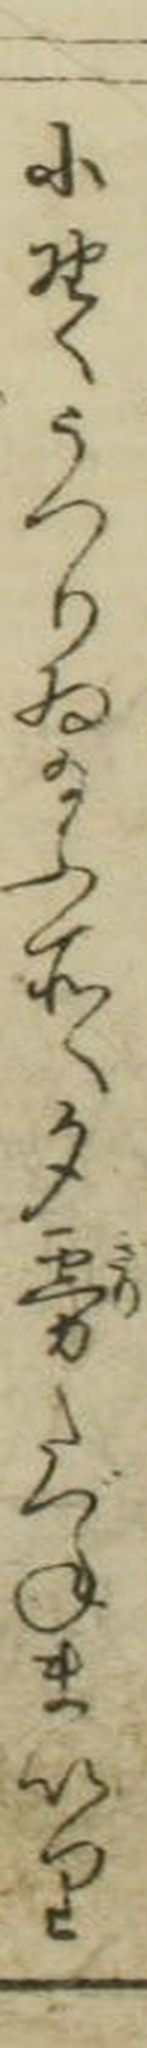小野へうつりゐ給ふ所へ夕霧たづねまいり
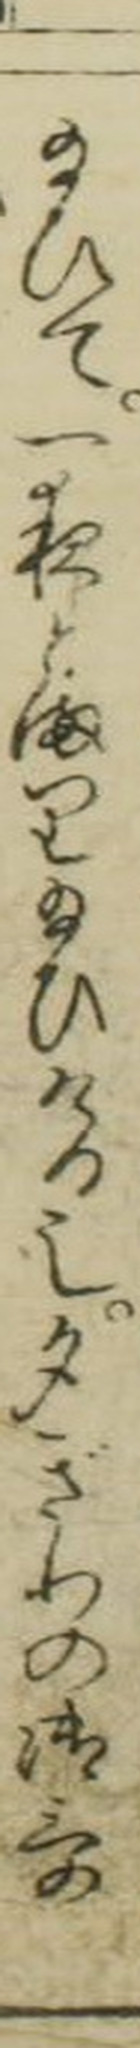給ひて。一夜とまり給ひける也。夕ぎりの御哥
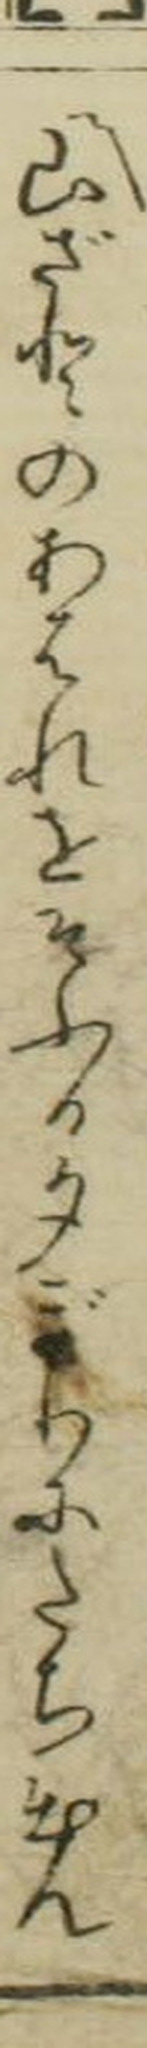〽山ざとのあはれをそふる夕ぎりにたち出ん
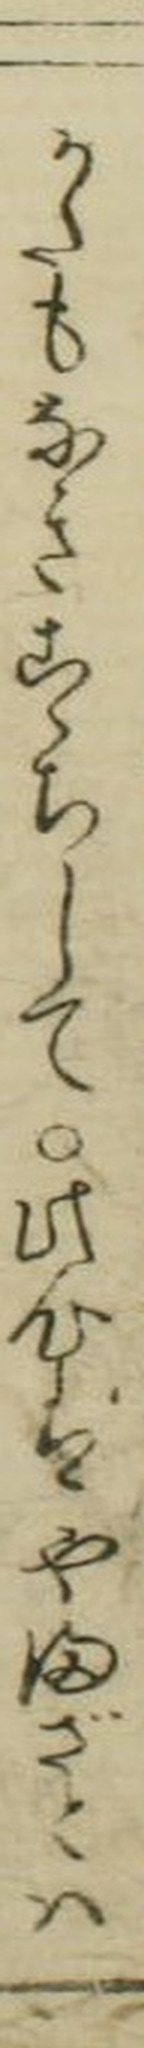かたもなきこゝちして◯此心はやまざとは
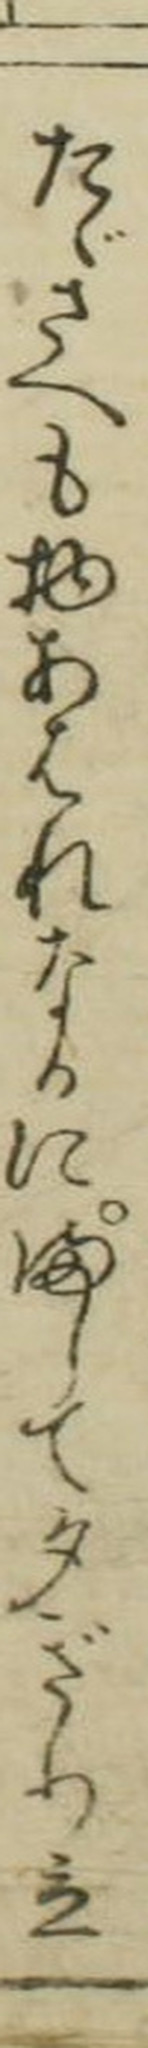たゞさへも物あはれなるに。まして夕ぎり立
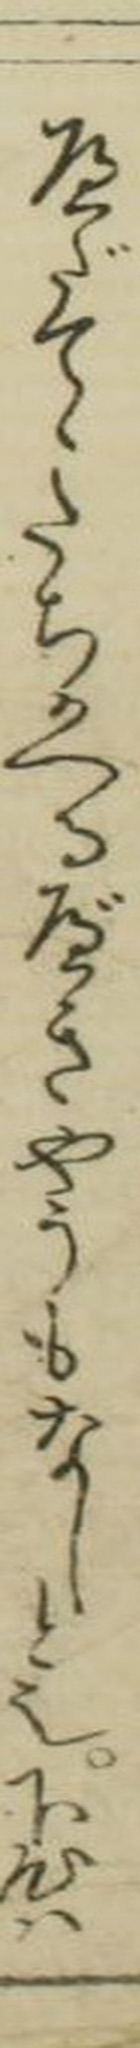へだてゝたちかへるべきやうもなしと也。下心は
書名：女源氏教訓鑑
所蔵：東京学芸大学附属図書館
